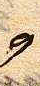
9
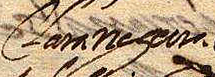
Clara nogeira
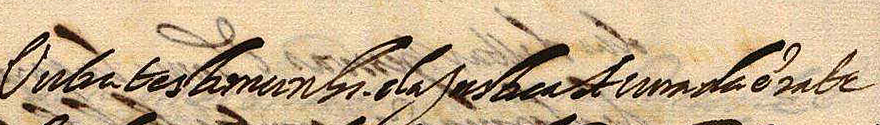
Outra testemunha da Justiça A iurada e rate
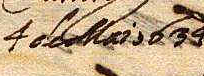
4 de Maio 634
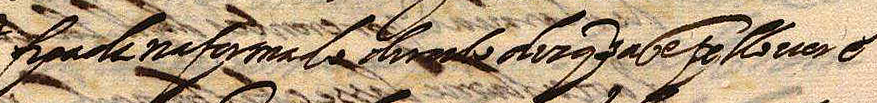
ficada na forma do direito diz q̄ sabe pello uer e
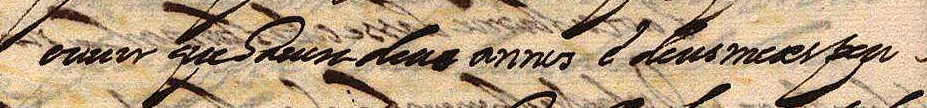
ouuir que hauera dous annos e dous meses pou
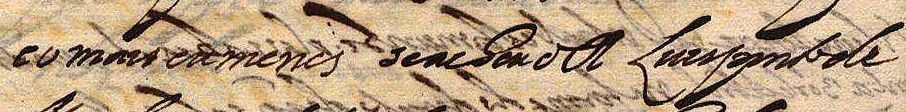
co mais ou menos se achou o R Luis pinto de
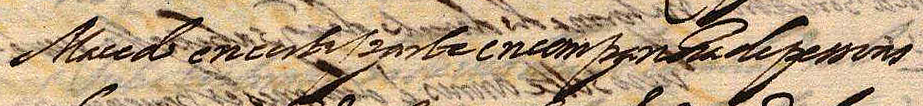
Macedo en certa parte en companhia de pessoas
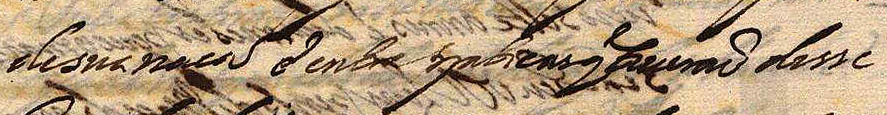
de sua naçaõ e entre praticas q̄ tiueraõ disse
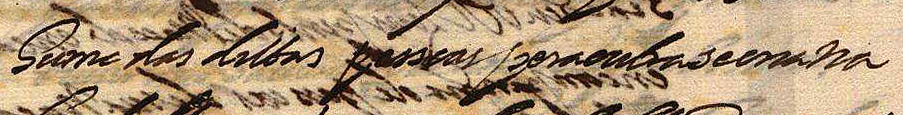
huma das dittas pessoas pera outra se cria na
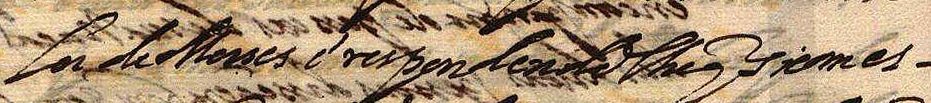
Lei de Moises e respondendolhe q̄ si com es
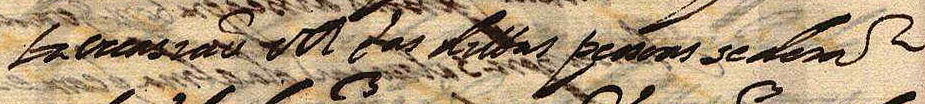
ta occasiaõ o R e as dittas pessoas se deraõ
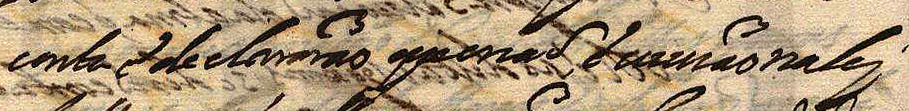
conta, e declararaõ que criaõ, e uiuiaõ na lej
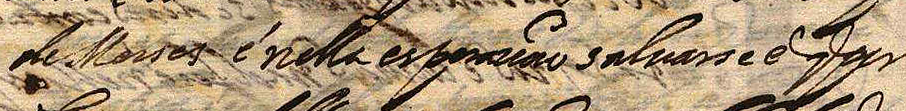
de Moises, e nella esperauaõ saluarse e q̄ por
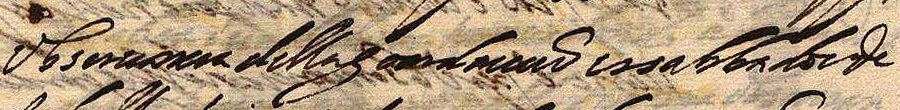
obseruancia della goardauaõ os sabbados de
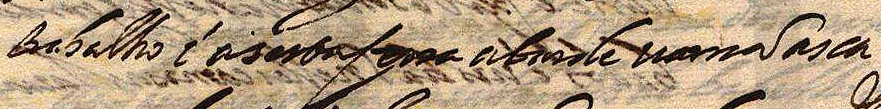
trabalho e a sesta feira a tarde uarriaõ as ca
